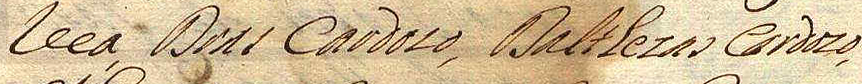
vea, Bras cardozo, Balthezar cardozo,
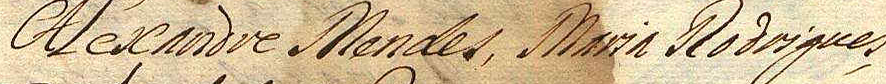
Alexandre Mendes, Maria Rodrigues,
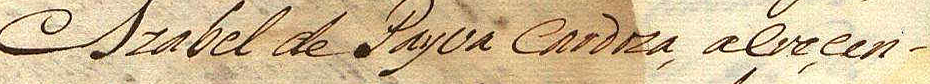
e Izabel de Payva cardoza, acreçen
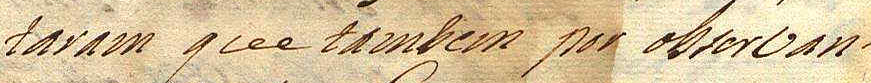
taram que tambem por observan
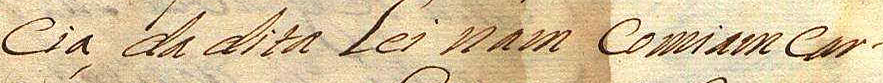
cia, da dita Lei nam comiam car
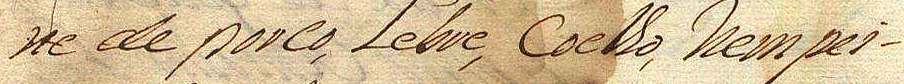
ne de porco, Lebre, coelho, nem pei
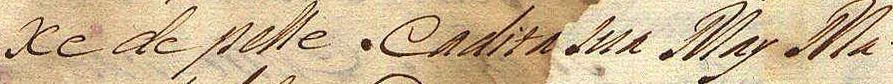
xe de pelle e a dita sua May Ma
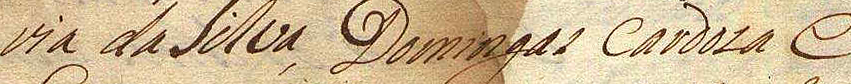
ria da Silva, Domingas cardoza e
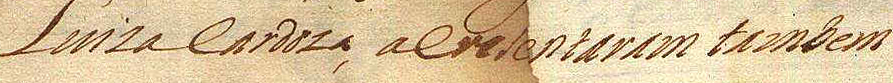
Luiza cardoza, acresentaram tambem
